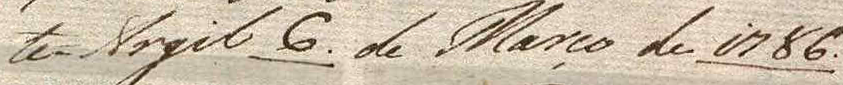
te Argil 6. de Março de i786
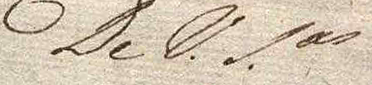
De V. S.as
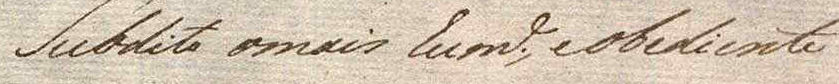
Subdito o mais hum.e, e obediente
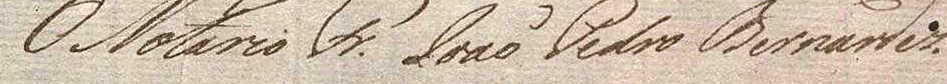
O Notario Fr. Ioaõ Pedro Bernardes.
